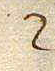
2
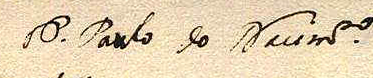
o P. Paulo do Nacim.to
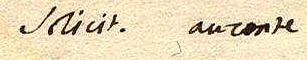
solicit. auzente
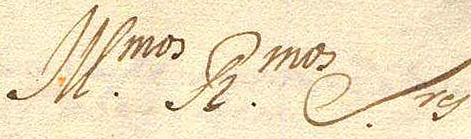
Ill.mos R.mos S.res
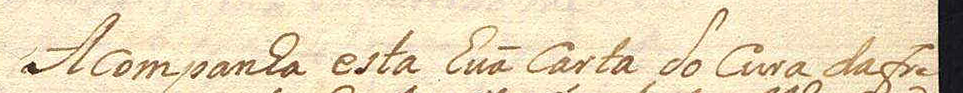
Acompanha esta huā Carta do Cura da fre
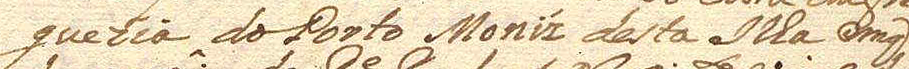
guezia do Porto Moniz̄ desta Ilha em q̄
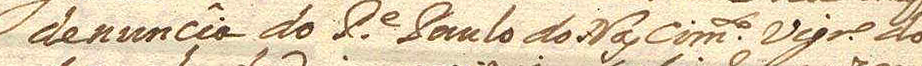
denuncia do P.e Paulo do Nascim.to vigr.o do
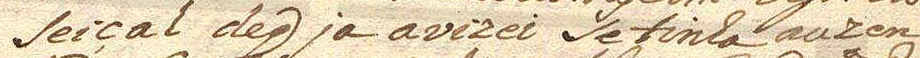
seiçal de q̄ ja avizei se tinha auzen
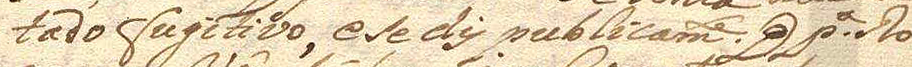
tado fugitivo, e se dis publicam.te q̄ p.a Ro
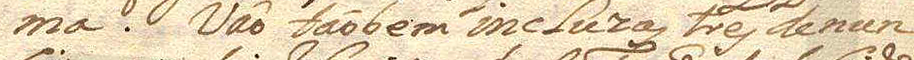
ma. Vão taõbem incluzas tres denun
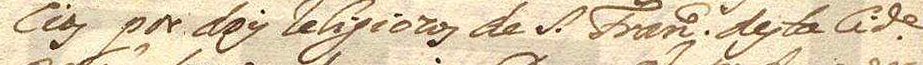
cias por dois Religiozos de S. Fran.co desta Cid.e
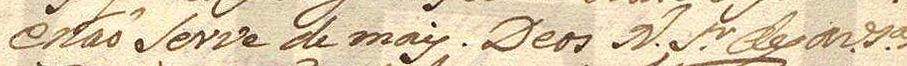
e naõ serve de mais. Deos N. S.r dg a v. s.as
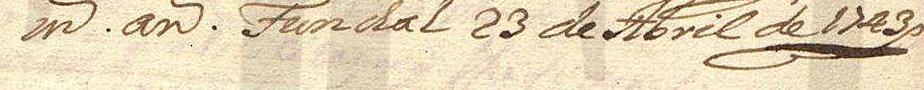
m̄. an̄. Funchal 23 de Abril de 1743
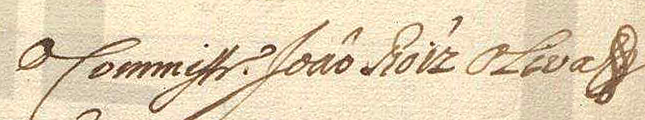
O Commissr.o Joaõ Roiz̄ OLiva
